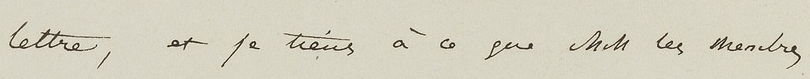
lettre, et je tiens à ce que MM les membres
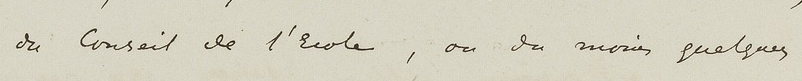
du Conseil de l'Ecole, ou du moins quelques
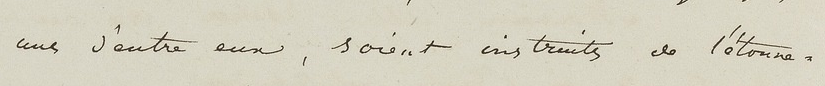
uns d'entre eux, soient instruits de l'étonne-
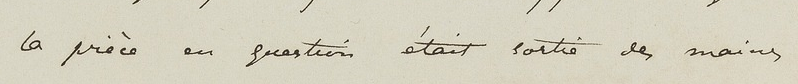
la pièce en question était sortie des mains
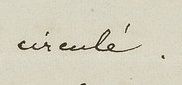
circulé.
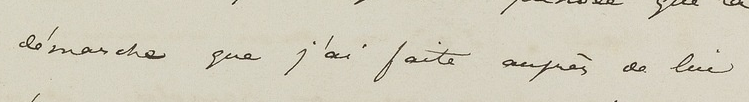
démarche que j'ai faite auprès de lui
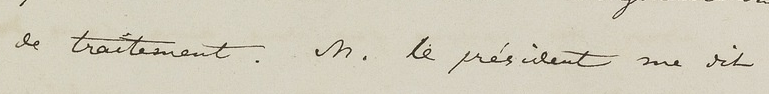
de traitement. M. le président me dit
